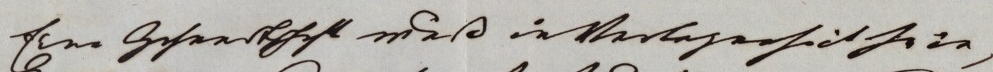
Eine Gesandtschaft muß in Verlegenheit sein,
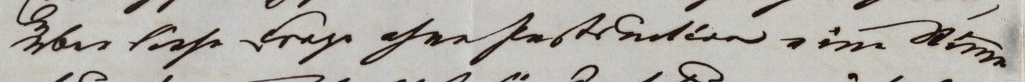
über diese Frage ohne Instruction eine Stimme
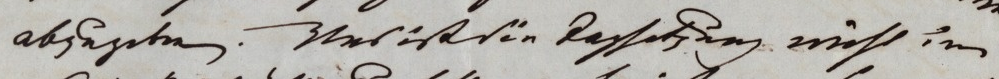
abzugeben. Und ist die Tagsatzung nicht im
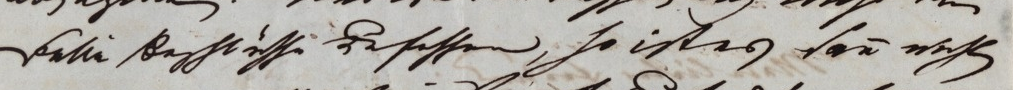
Falle Beschlüsse zu fassen, so ist es dann nicht
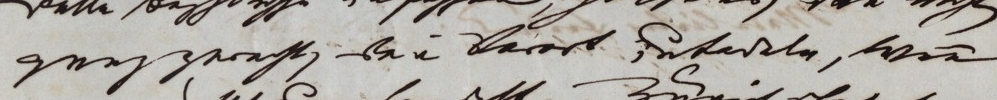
ganz gerecht, den Vorort zu tadeln, wenn
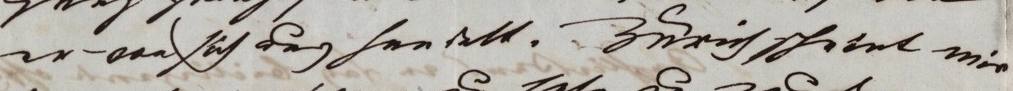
er von sich aus handelt. Zürich scheint mir
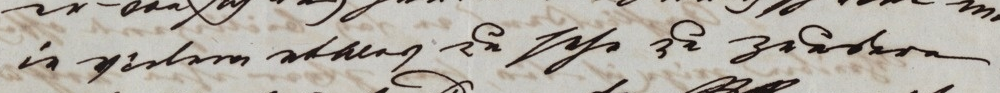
in vielem etwas zu sehr zu zaudern.
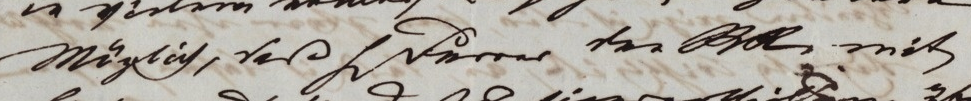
Möglich, daß Herr Furrer den RR. mit
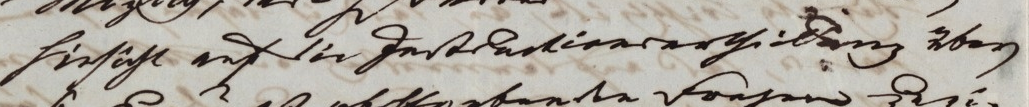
Hinsicht auf die Instructionsertheilung über
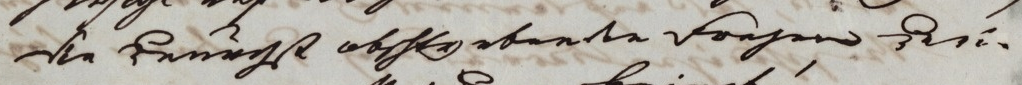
die zunächst obschwebenden Fragen zu ei-
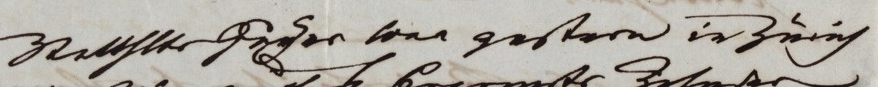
Statthltr Guyer war gestern in Zürich
